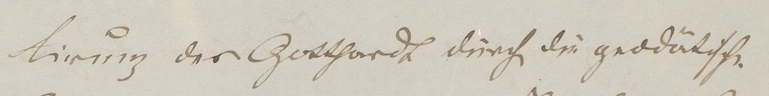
lirung des Gotthardt durch die geodätische
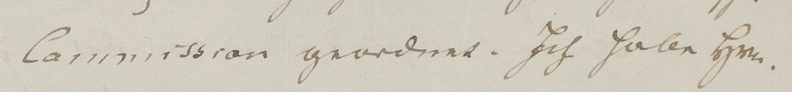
Commission geordnet. Ich habe Hrn.
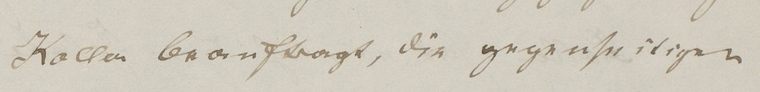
Koller beauftragt, die gegenseitigen
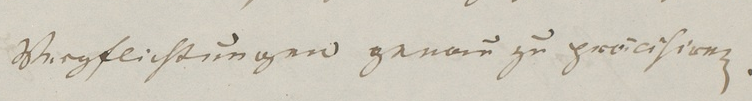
Verpflichtungen genau zu präcisiren.
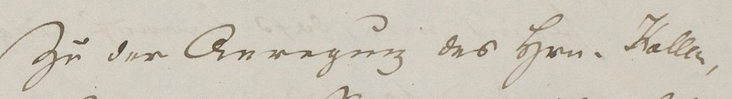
Zu der Anregung des Hrn. Koller,
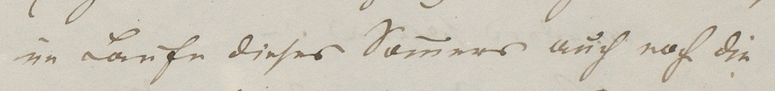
im Laufe dieses Sommers auch noch die
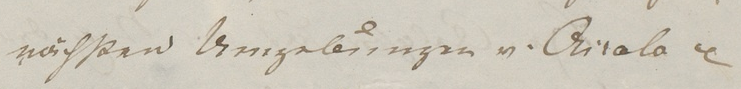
nächsten Umgebungen v. Airolo &
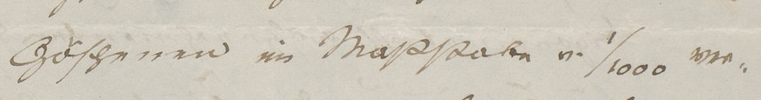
Göschenen im Maßstabe v. 1/1000 ver-
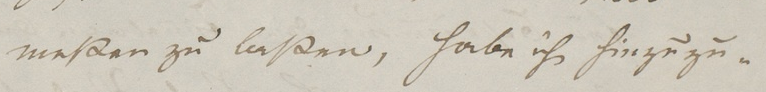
meßen zu laßen, habe ich hinzuzu-
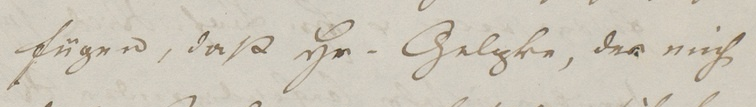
fügen, daß Hr. Gelpke, der mich
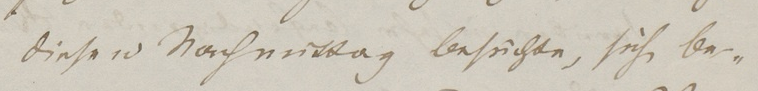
diesen Nachmittag besuchte, sich be-
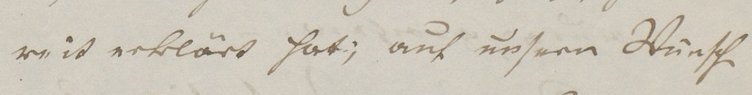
reit erklärt hat, auf unsern Wunsch
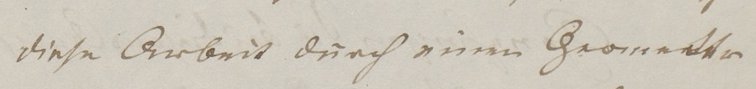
diese Arbeit durch einen Geometer
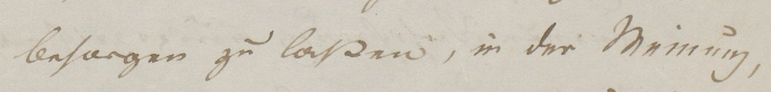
besorgen zu laßen, in der Meinung,
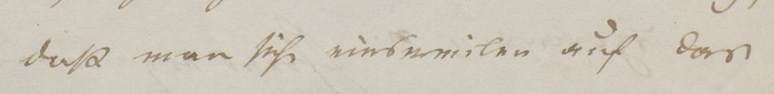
daß man sich einsweilen auf das
